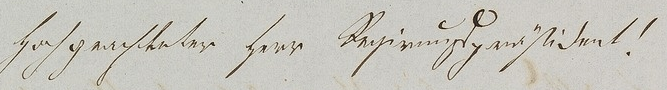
Hochgeachteter Herr Regirungspräsident!
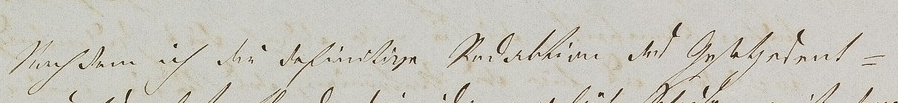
Nachdem ich die definitive Redaktion des Gesetzesent-
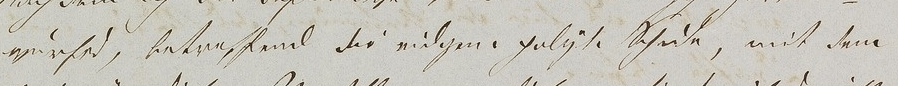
wurfes, betreffend die eidgen. polyt. Schule, mit dem
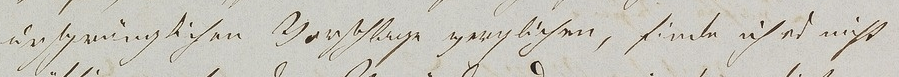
ursprünglichen Vorschlage verglichen, finde ich es nicht
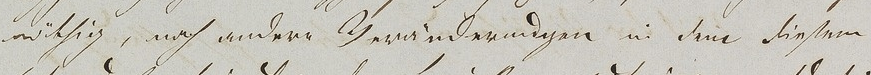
nöthig, noch andere Veränderungen in dem diesem
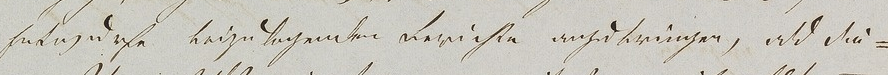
Entwurfe beizulegenden Berichte anzubringen, als die
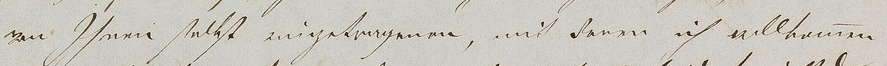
von Ihnen selbst eingetragenen, mit denen ich vollkommen
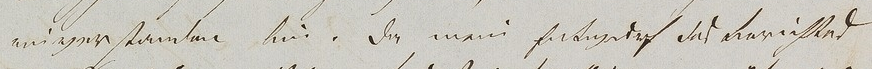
einverstanden bin. Da mein Entwurf des Berichtes
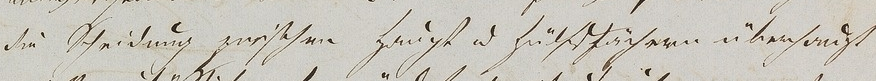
die Scheidung zwischen Haupt u Hülfsfächern überhaupt
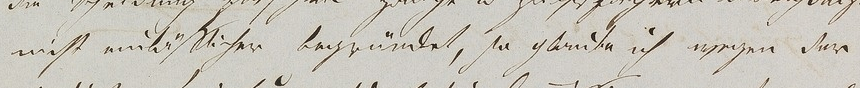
nicht einlässlicher begründet, so glaube ich wegen der
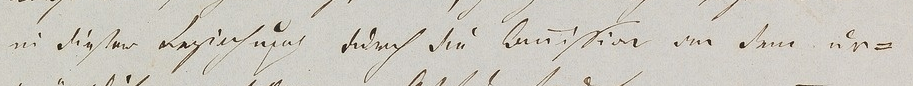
in dieser Beziehung durch die Commission an dem ur-
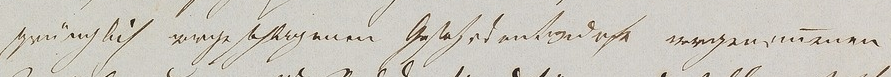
sprünglich vorgeschlagenen Gesetzesentwurfe vorgenommenen
